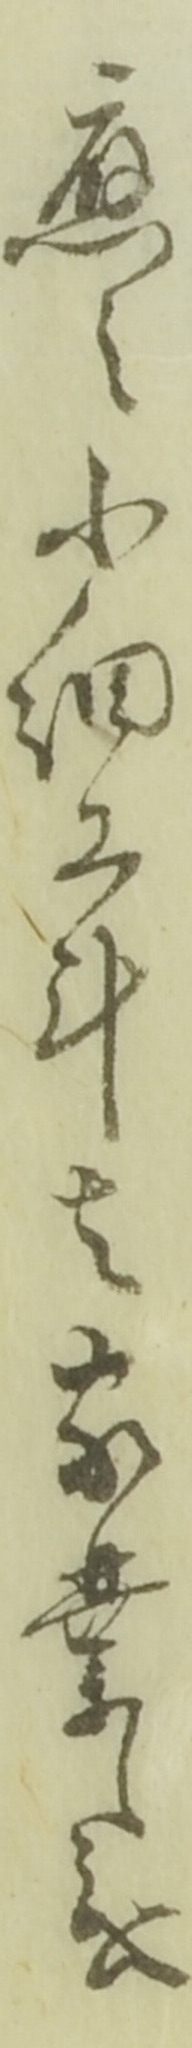應之小細工斗者家業之義
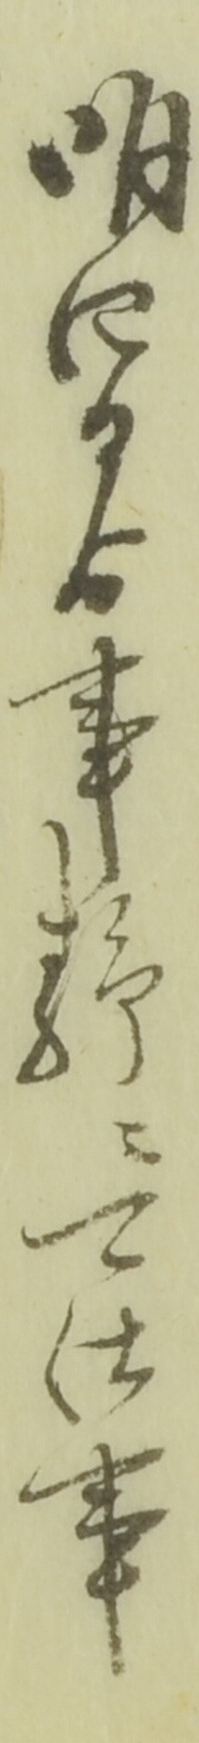明四日ゟ事静ニ可仕事
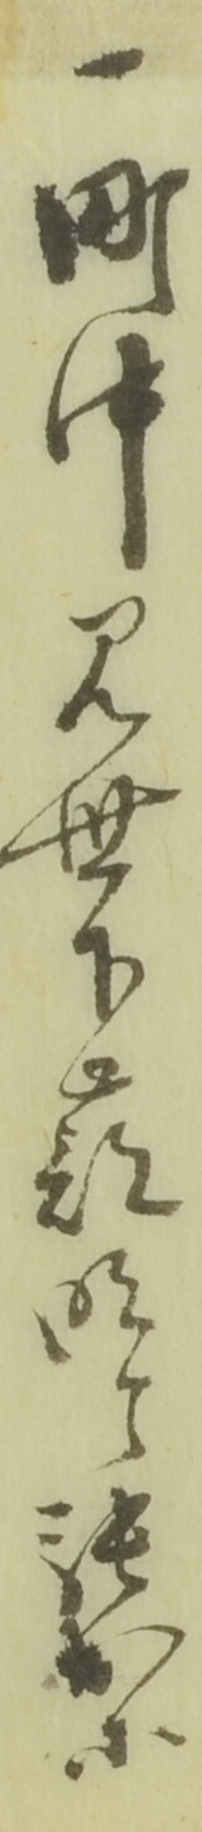一町中見世下蔀明ケ張出等
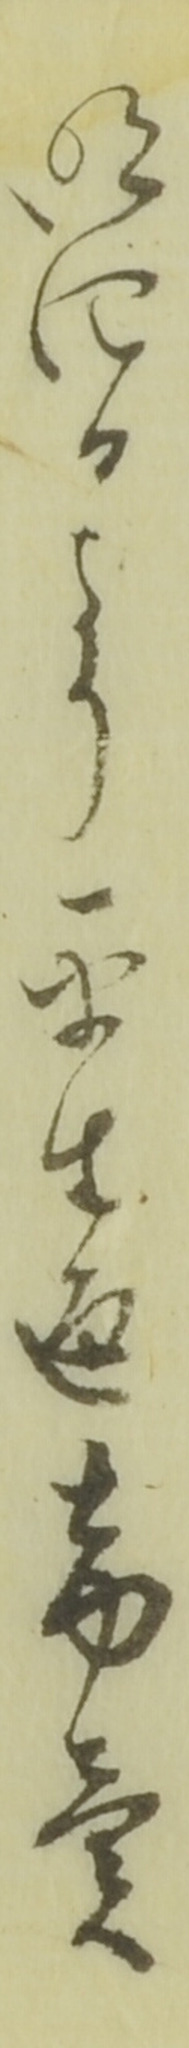明四日より平生通商売
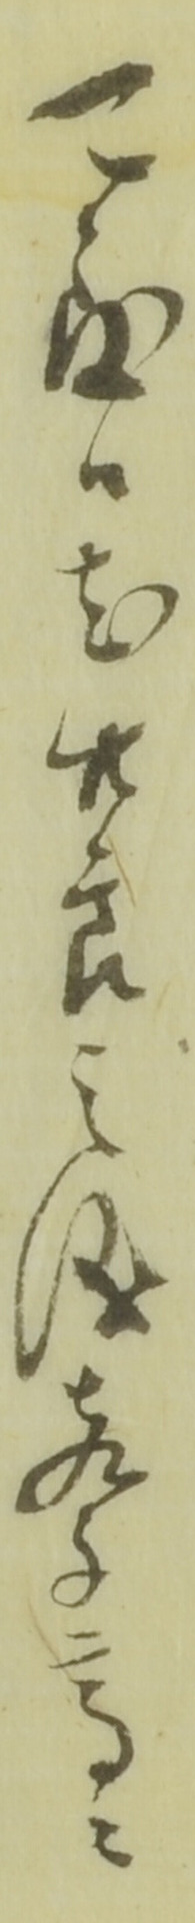可致候尤此節之儀声高ニ
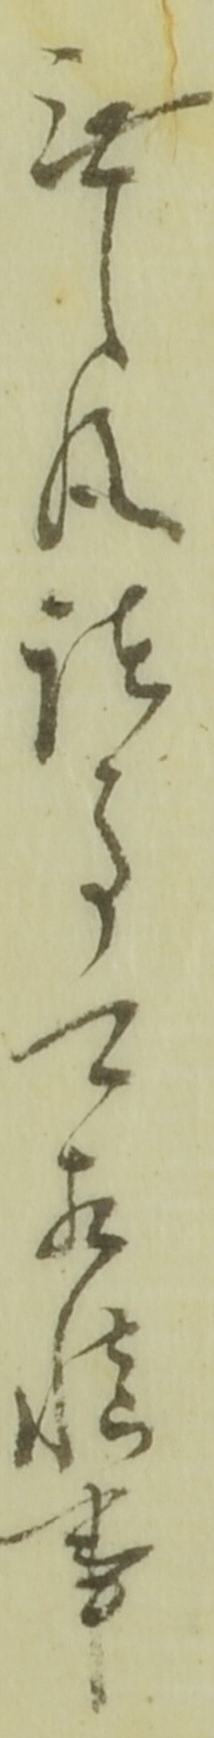無之様諸事可相慎事
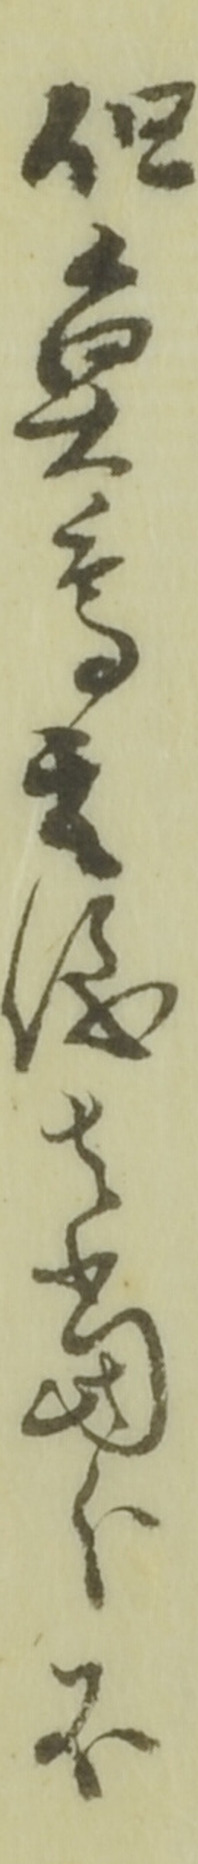但魚鳥其儀者当分不
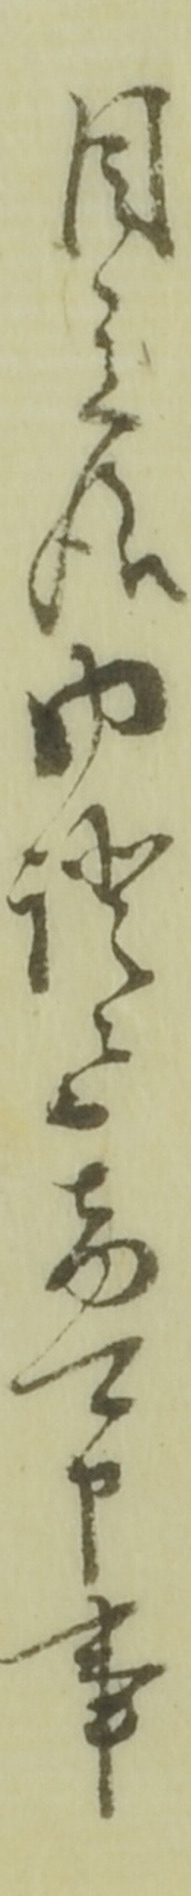目立様内證ニ而商可申事
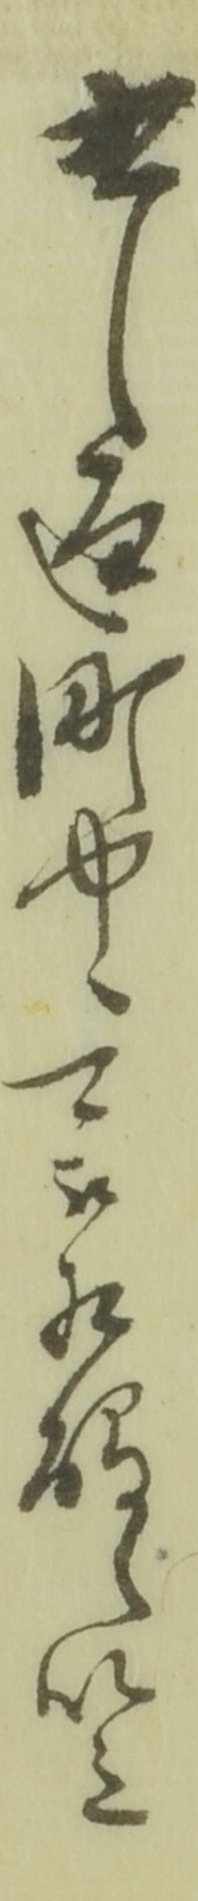右之通町中へ可被相触候以上
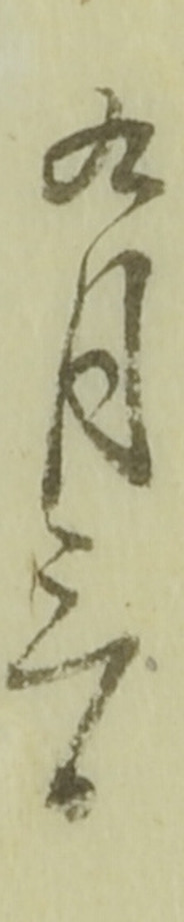九月三日
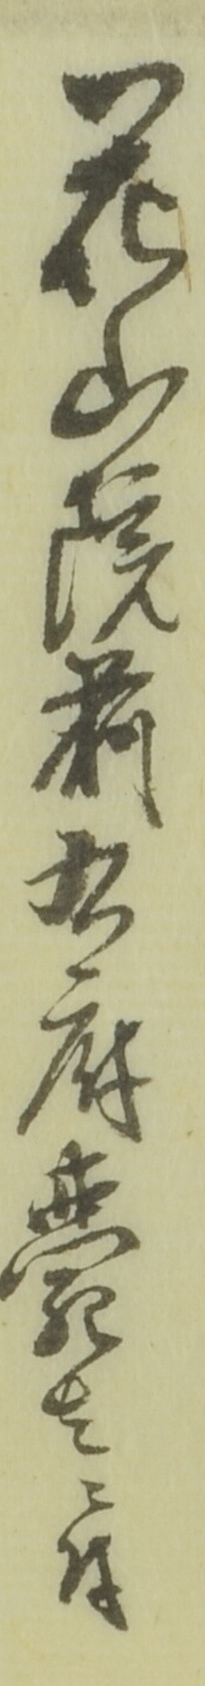花山院前右府薨者ニ付
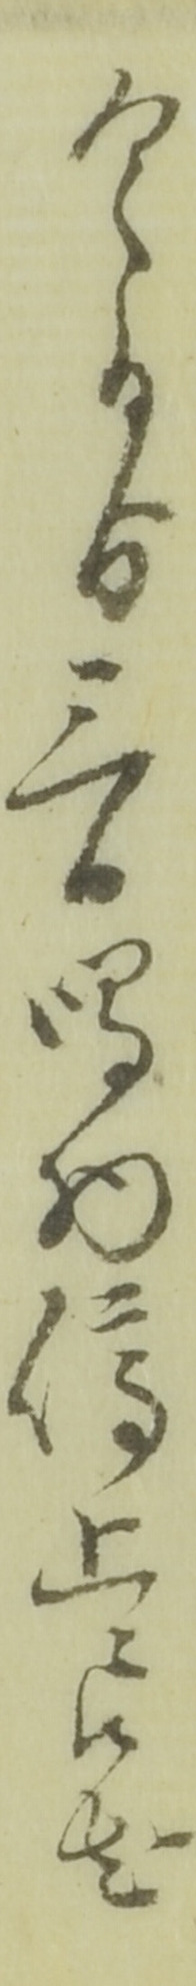今日ゟ三日鳴物停止ニ候尤
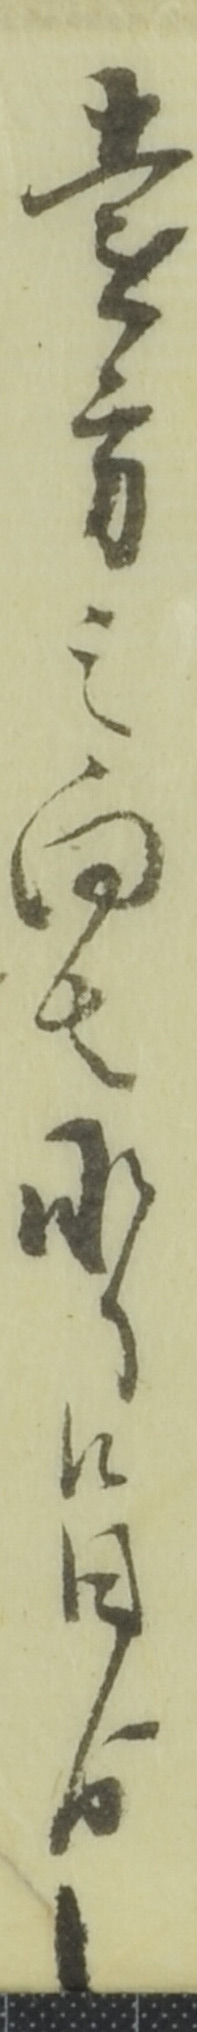遠方之向者承り候日ゟ
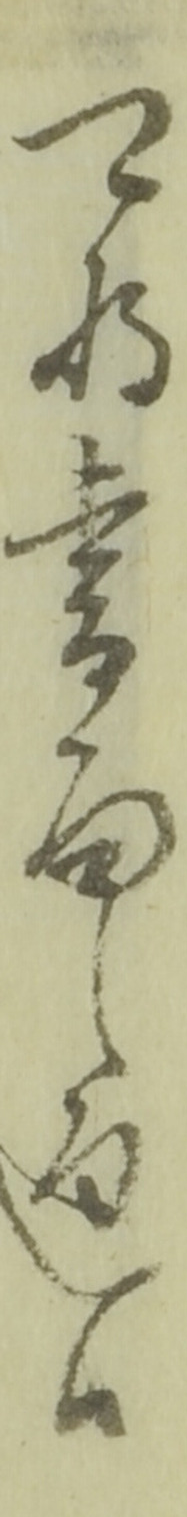可為書面之通候
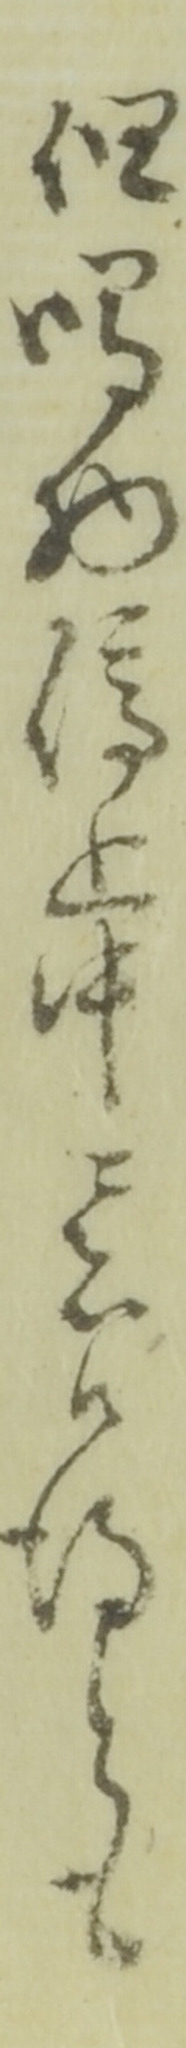但鳴物停止中ニ者候得とも
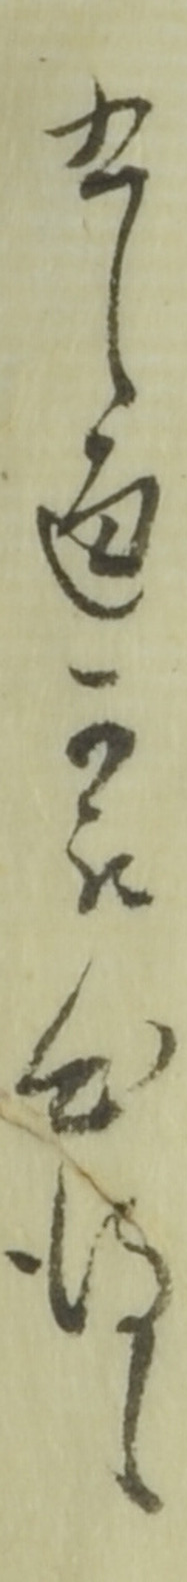右之通可被心得候
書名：御触書御書附控帳
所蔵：伊那市立高遠町図書館・合同会社AMANE
